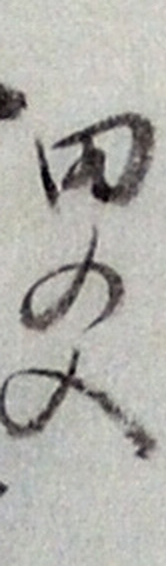田の入
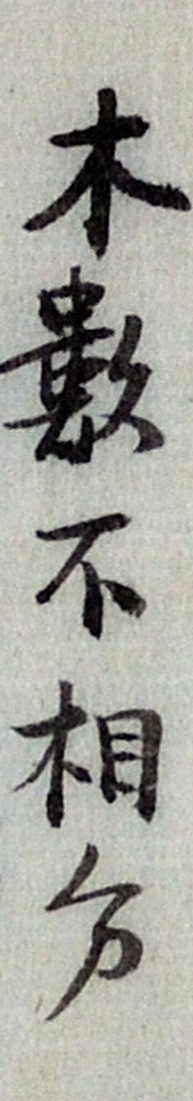木数不相分
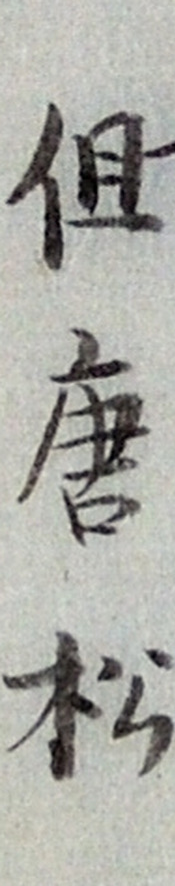但唐松
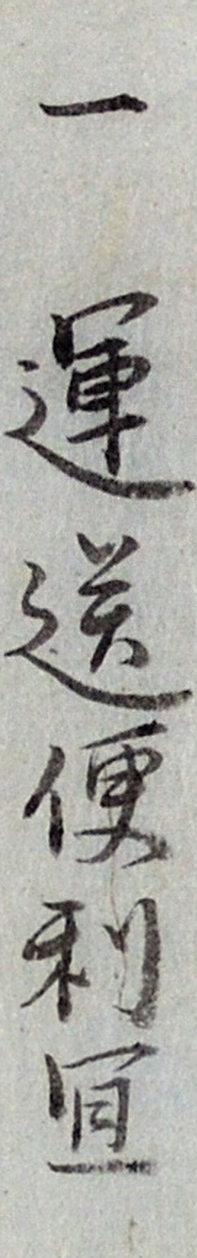一運送便利宜
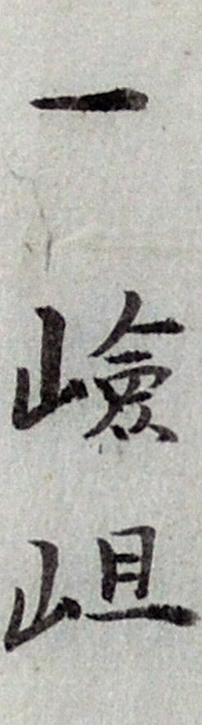一嶮岨

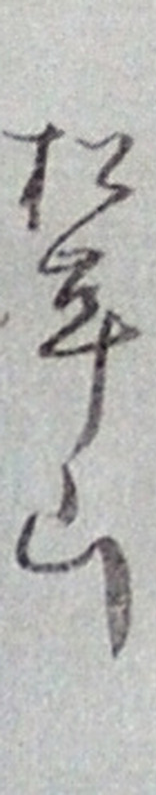松茸山
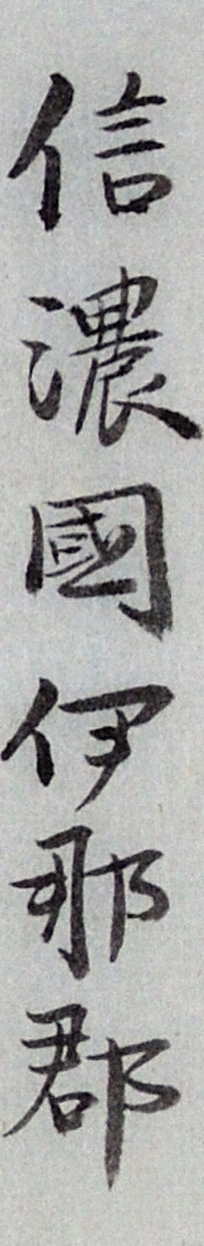信濃国伊那郡
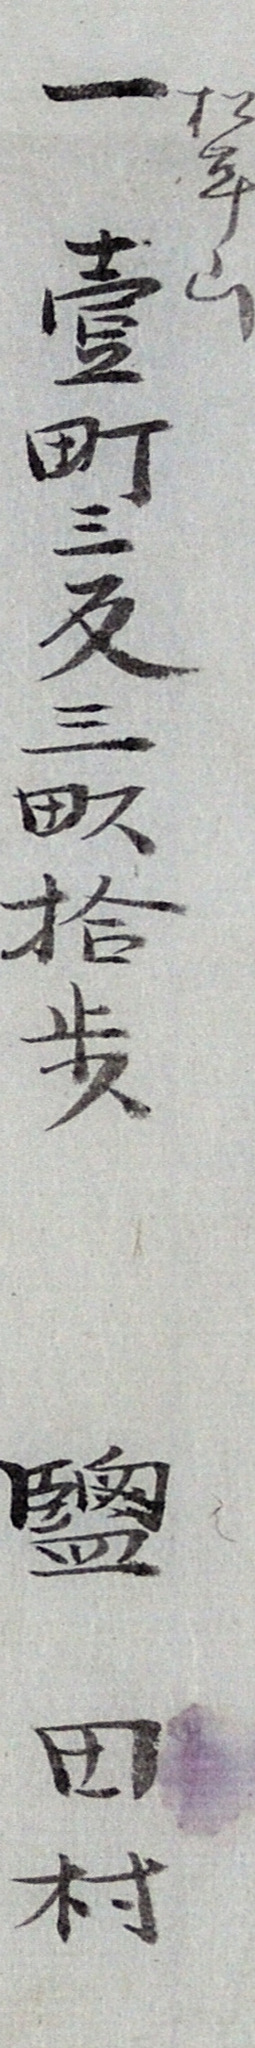一壱町三反三㽗拾歩塩田村
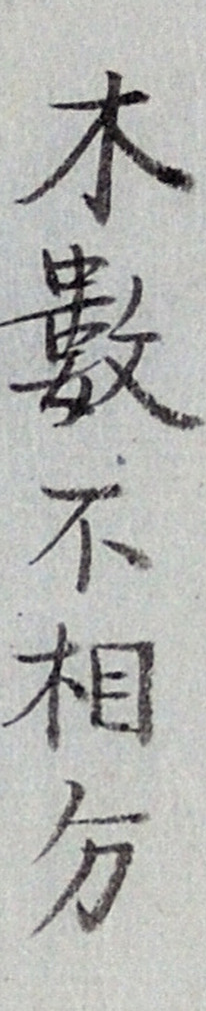木数不相分
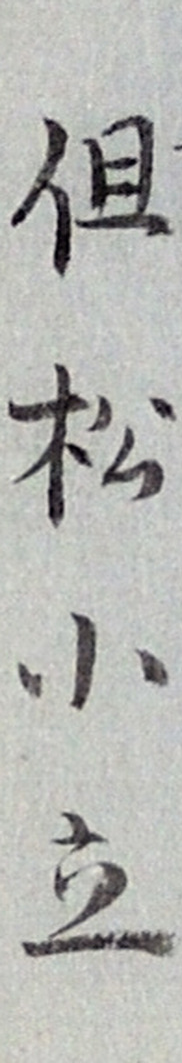但松小立
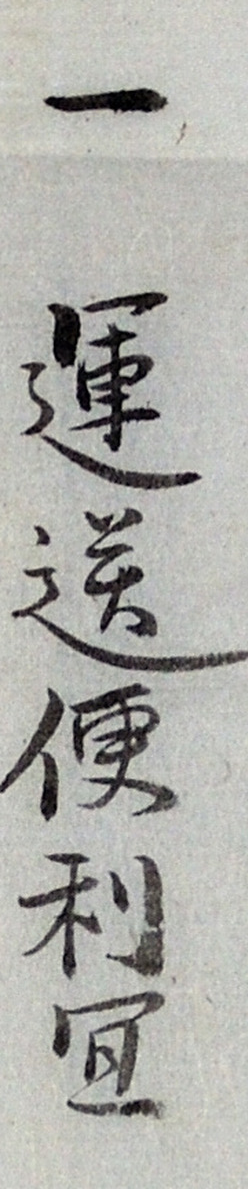一運送便利宜
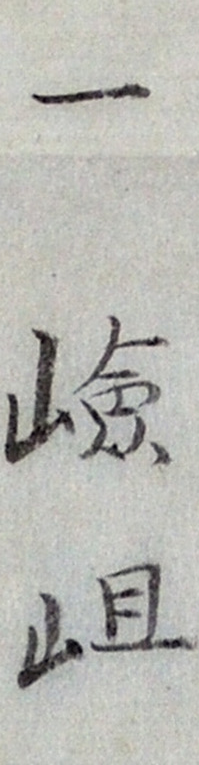一嶮岨
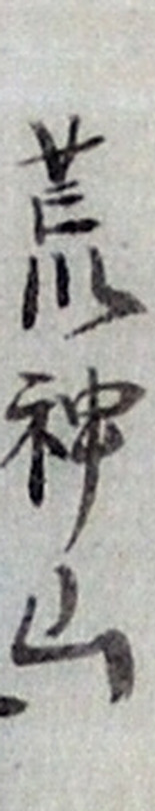荒神山
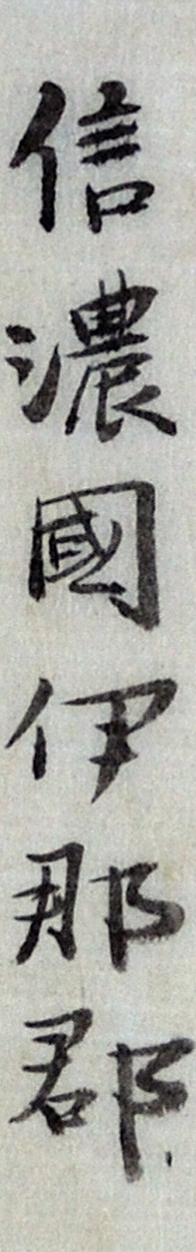信濃国伊那郡
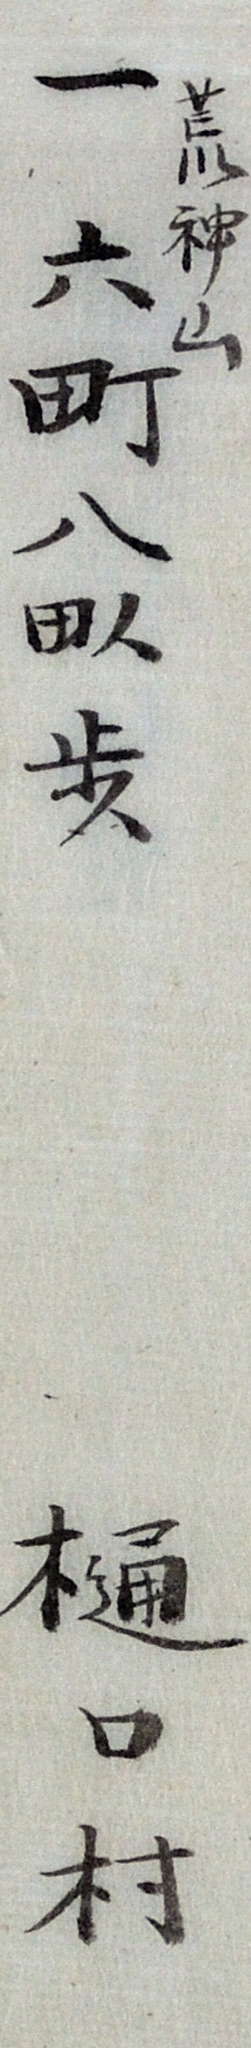一六町八㽗歩樋口村
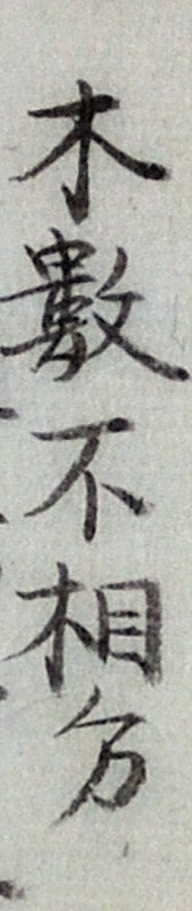木数不相分
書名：官林反別帳
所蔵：伊那市立高遠町図書館・合同会社AMANE
